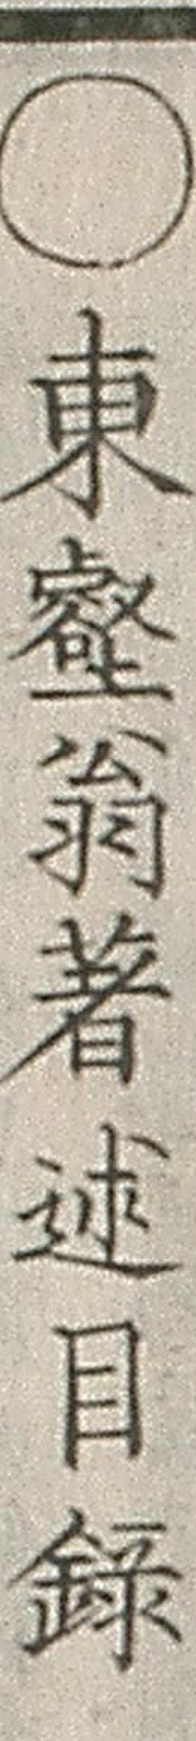〇東壑翁著述目録
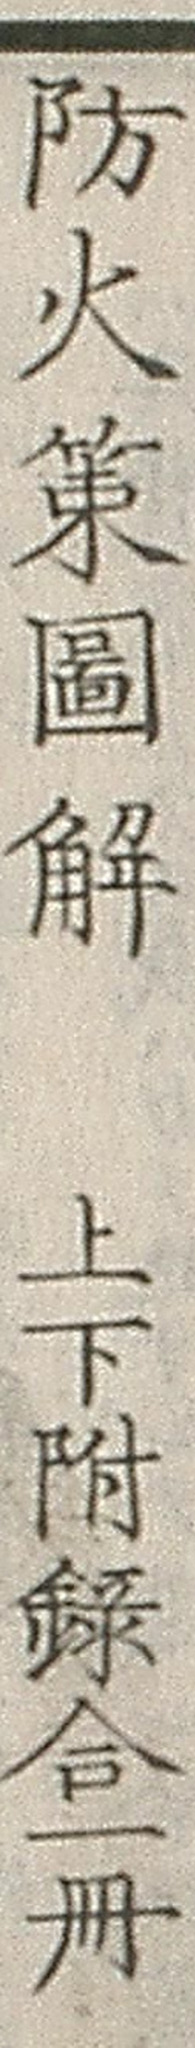防火策図解上下附録合一冊
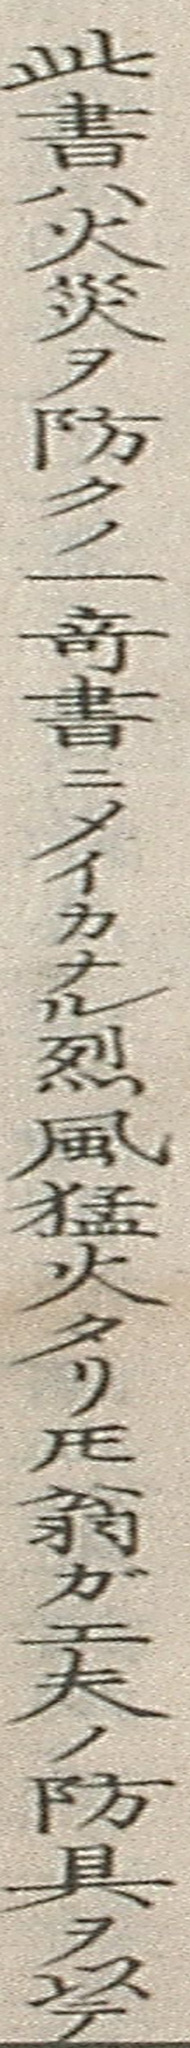此書ハ火災ヲ防クノ一奇書ニ乄イカナル烈風猛火タリトモ翁ガ工夫ノ防具ヲ以テ
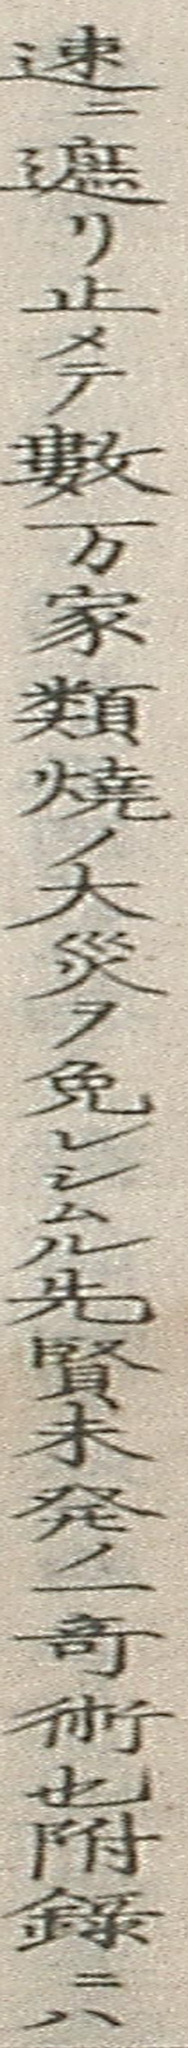速ニ遮リ止メテ数万家類焼ノ大災ヲ免レシムル先賢未発ノ一奇術也附録ニハ
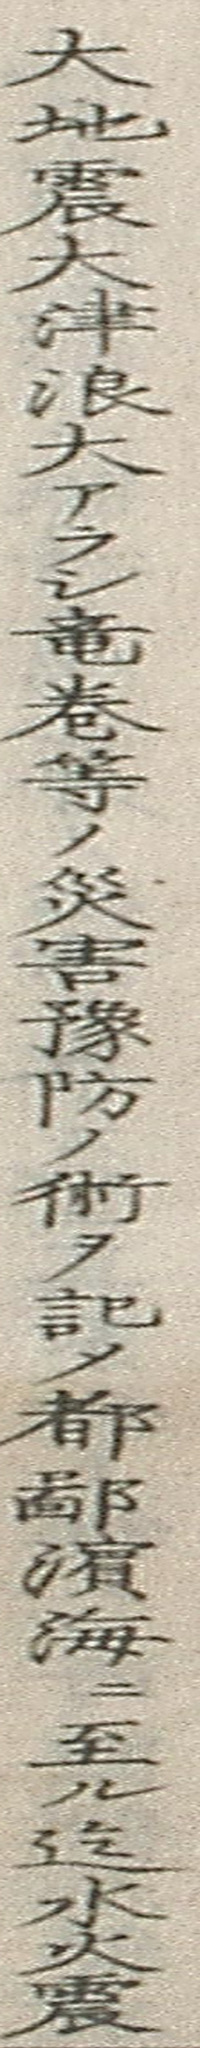大地震大津浪大アラシ竜巻等ノ災害予防ノ術ヲ記乄都鄙浜海ニ至ル迄水火震
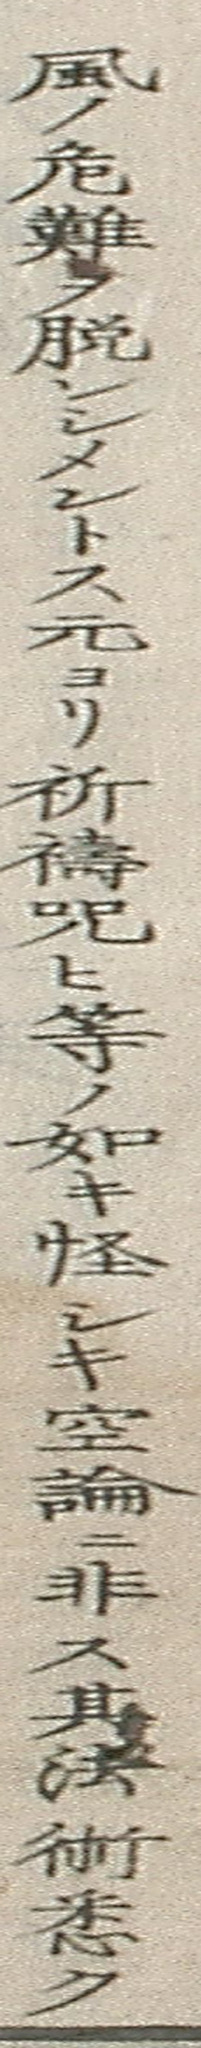風ノ危難ヲ脱レシメントス元ヨリ祈祷咒ヒ等ノ如キ怪シキ空論ニ非ス其法術悉ク
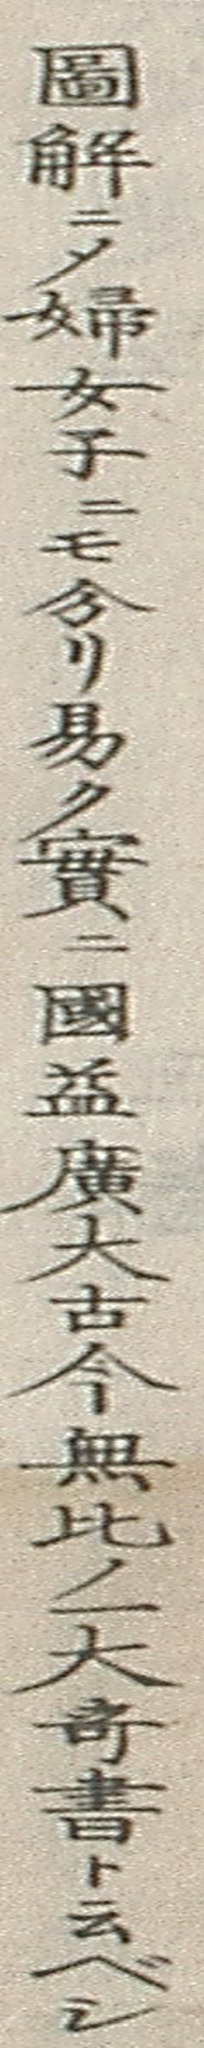図解ニ乄婦女子ニモ分リ易ク実ニ国益広大古今無比ノ一大奇書ト云ベシ
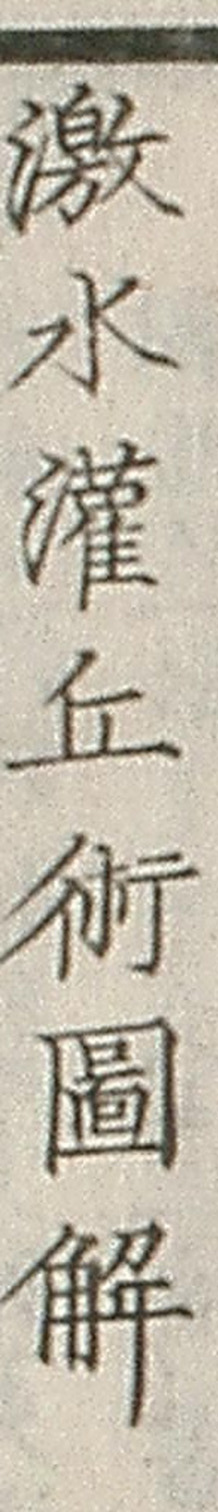激水灌丘術図解全
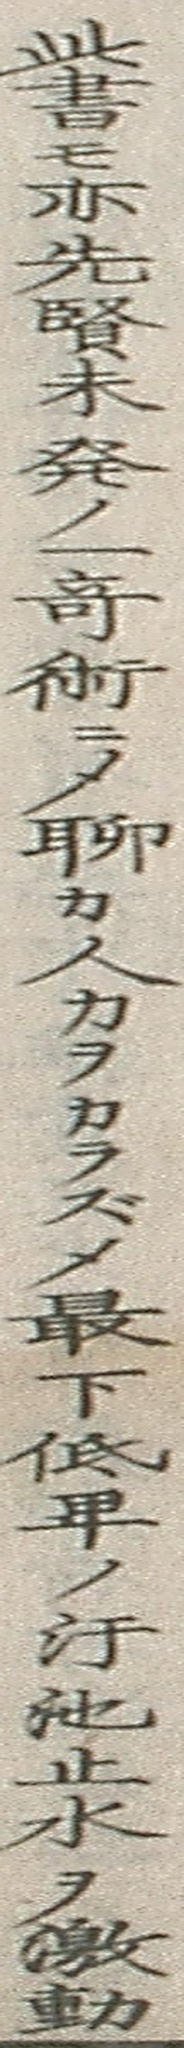此書モ亦先賢未発ノ一奇術ニ乄聊カ人力ヲカラズ乄最下低卑ノ汗池止水ヲ激動
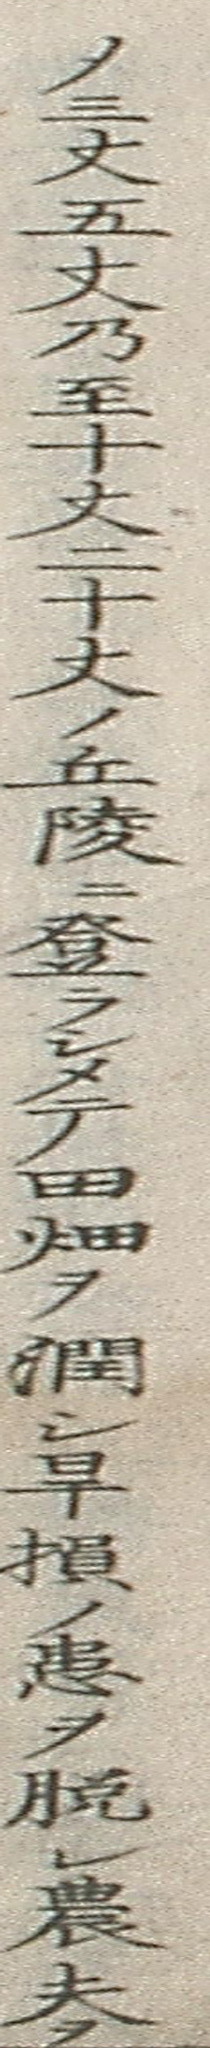乄三丈五丈乃至十丈二十丈ノ丘陵ニ登ラシメテ田畑ヲ潤シ旱損ノ患ヲ脱レ農夫ヲ
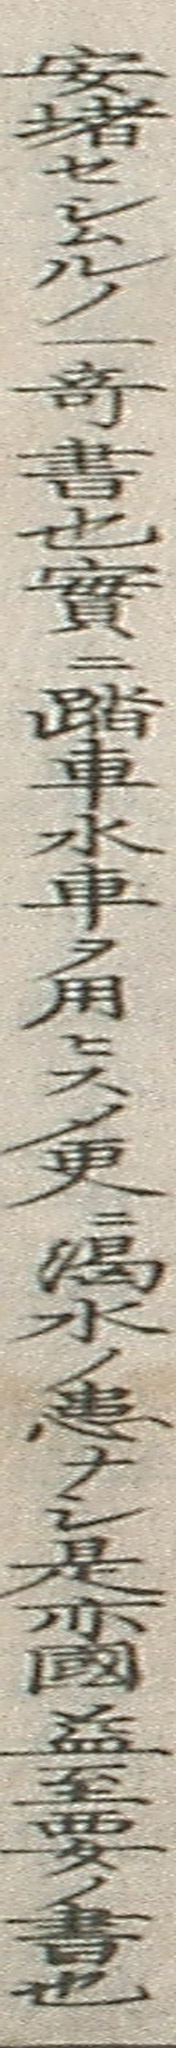安堵セシムルノ一奇書也実ニ踏車水車ヲ用ヒス乄更ニ渇水ノ患ナシ是亦国益至要ノ書也
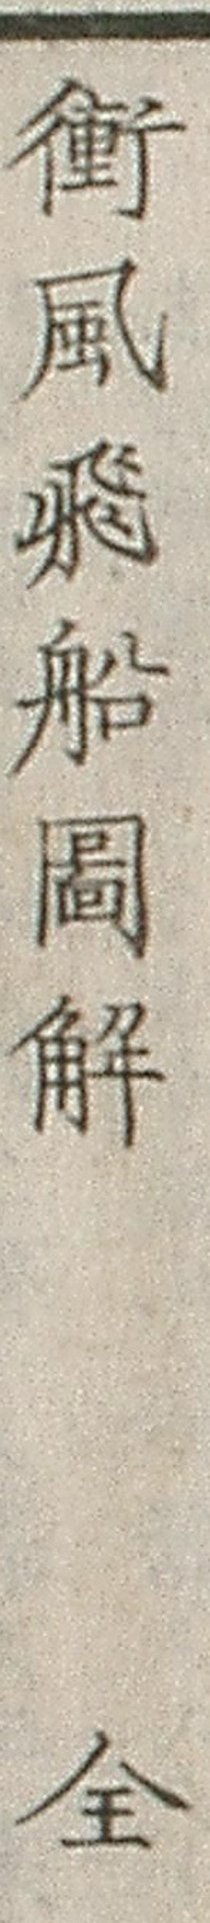衝風飛船図解全
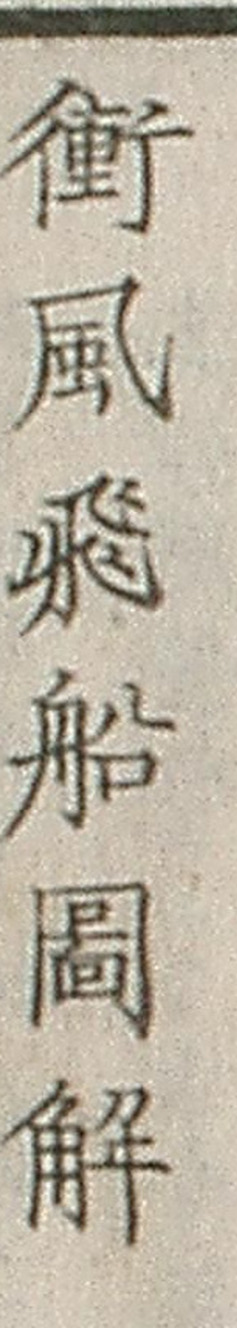衝風飛船図解全

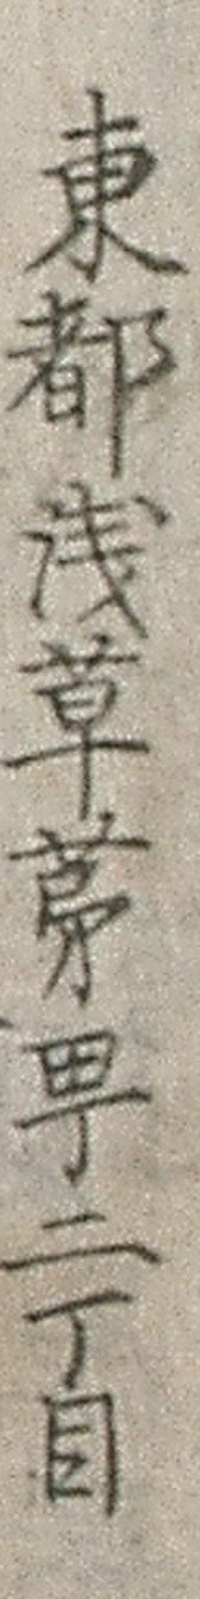東都浅草茅町二丁目
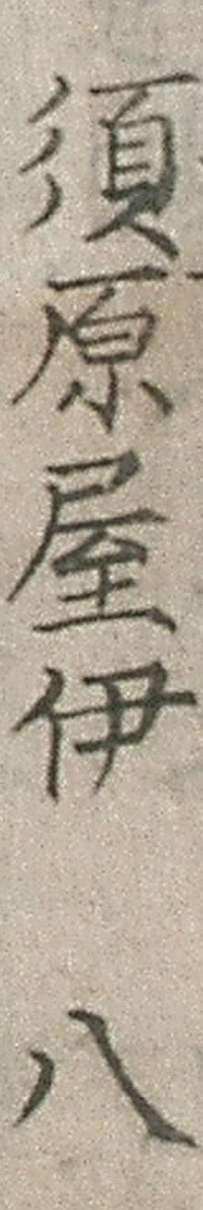須原屋伊八
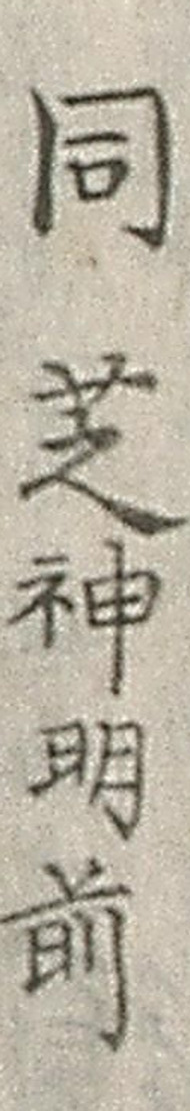同芝神明前
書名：附録　地震劇風災害豫防法圖説（内題）
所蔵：東京大学地震研究所図書室 Earthquake Research Institute Library, The University of Tokyo, JAPAN
